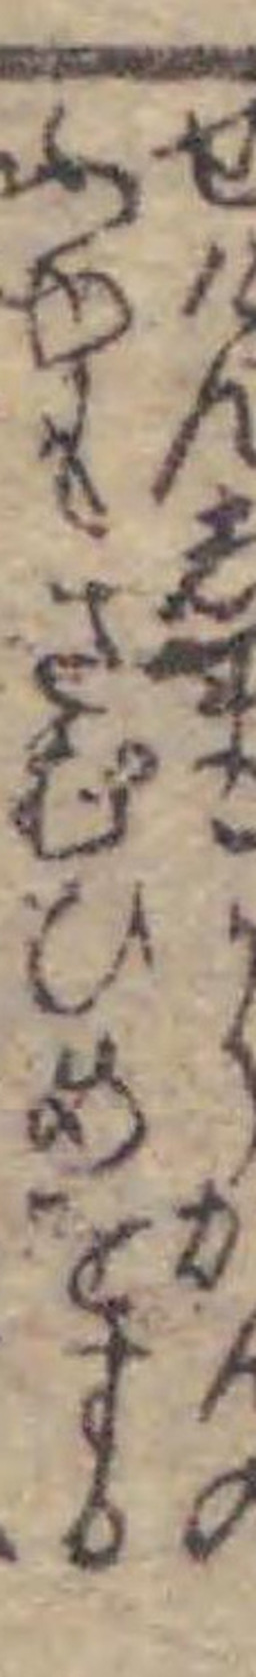ふゆもさむひめをする
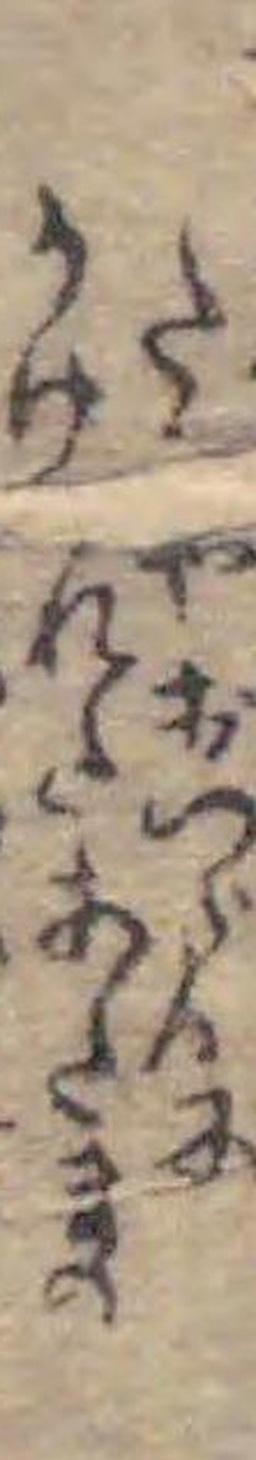たゝかれたあたまの
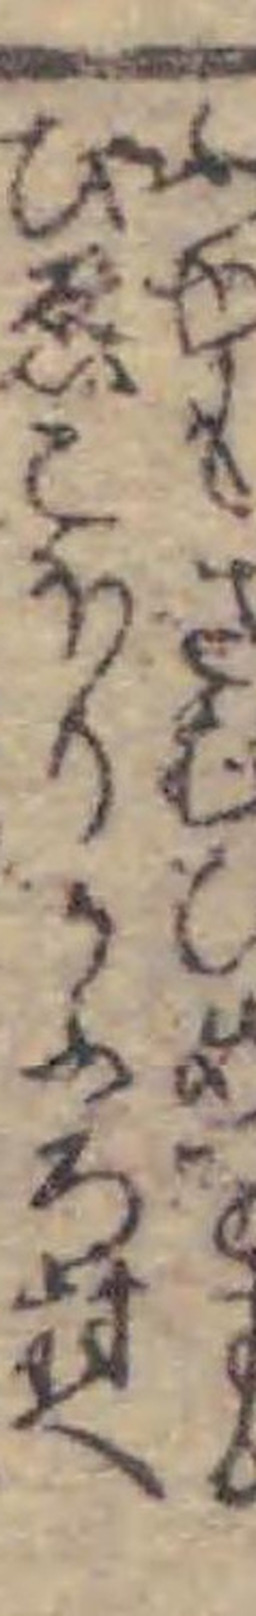びゑこほりかふろ村へ
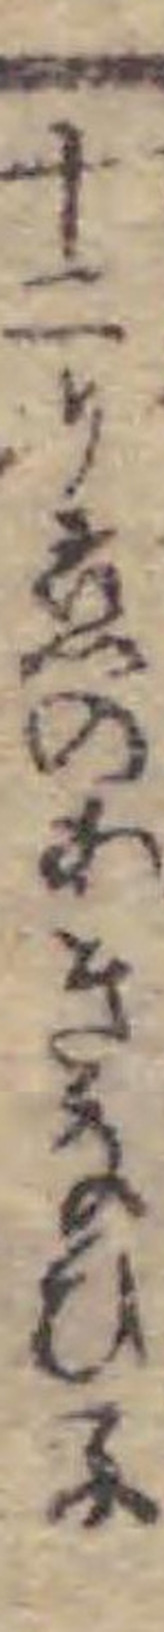十二り恋のあきなひ子
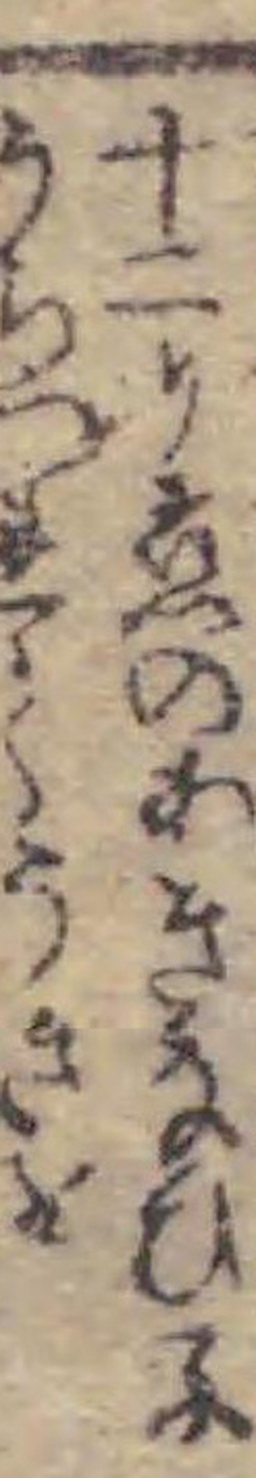うちつれてうさを
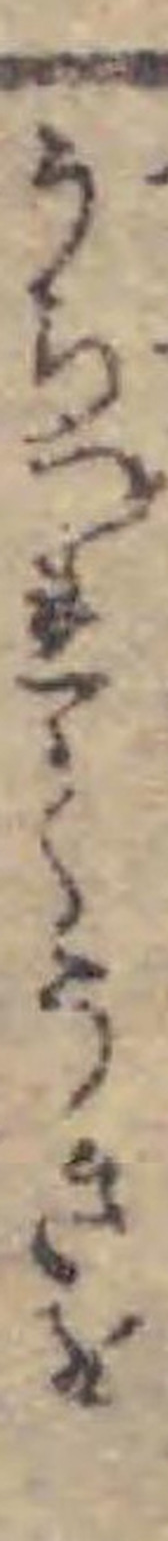うちつれてうさを
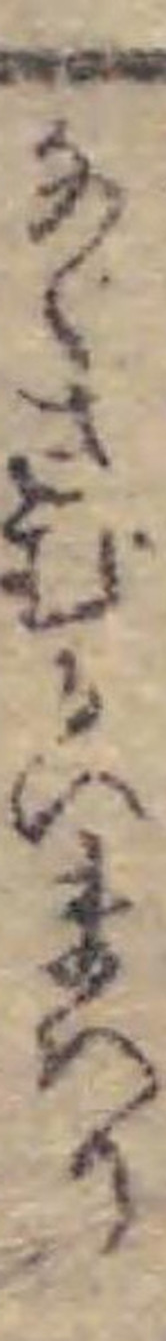なぐさむかひまはり
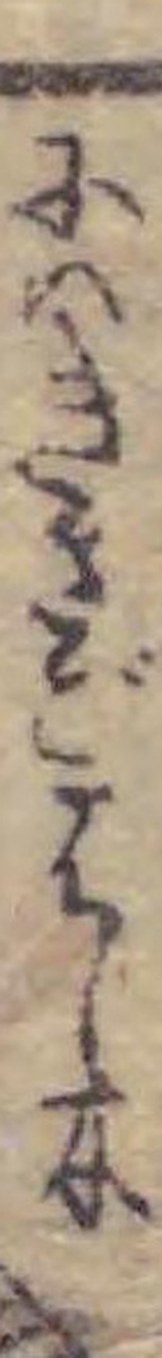にはきさごはし木
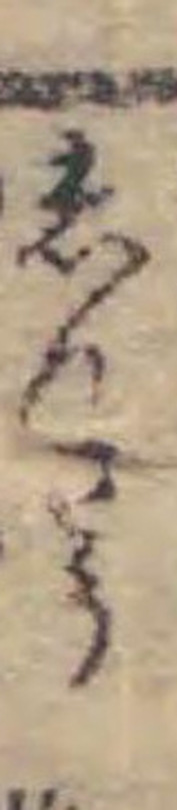しんさう
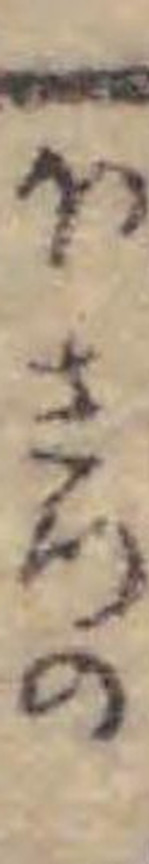ほさつの
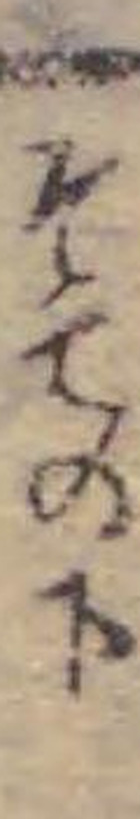そての下
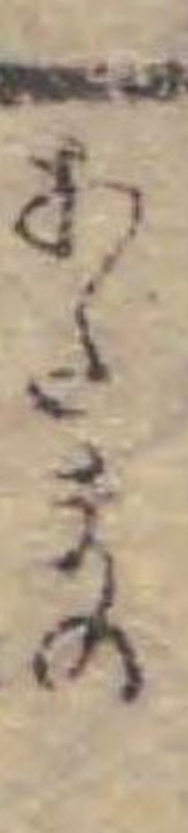あたまの
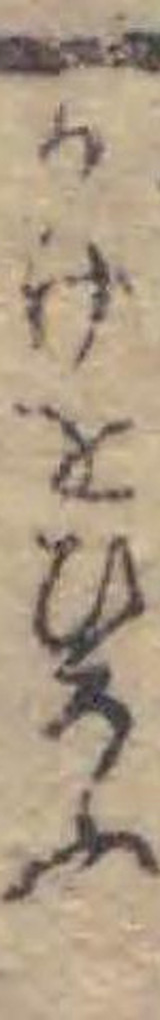かけをひろふ
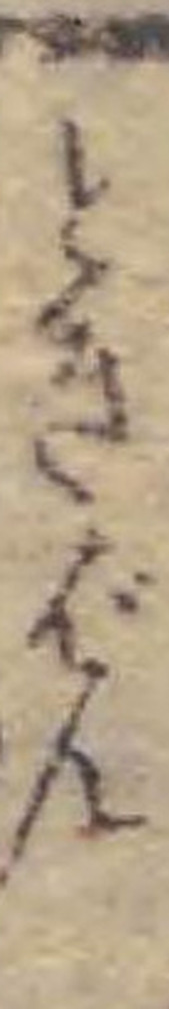ときばん
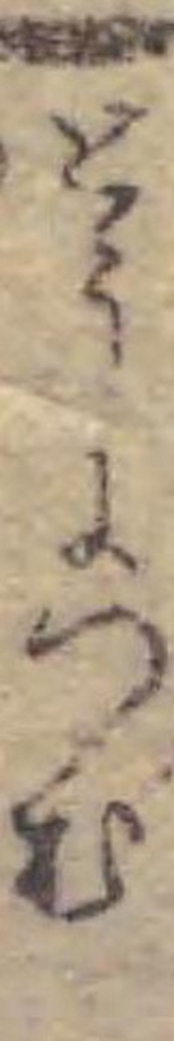とうにつむ
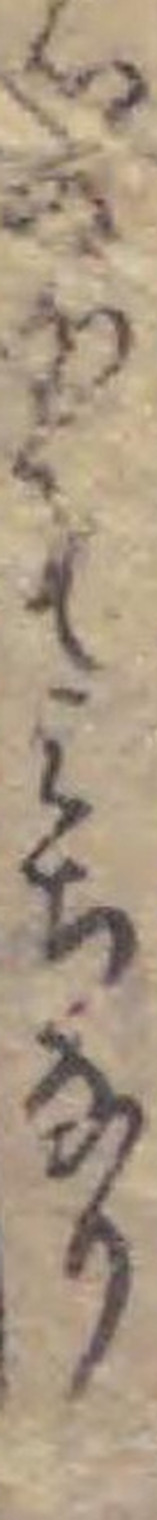心のほそみちなり
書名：北国順礼唄方便 : 3巻
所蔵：国立国会図書館 National Diet Library, JAPAN
